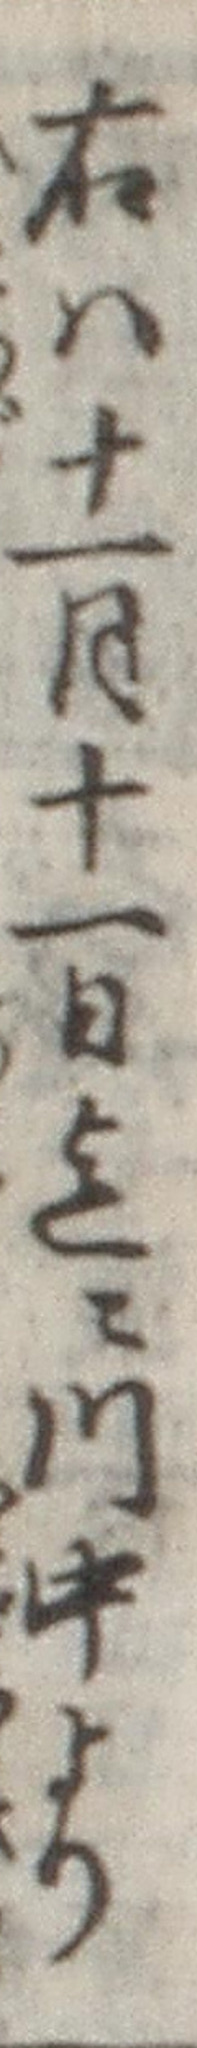右は十一月十一日迄に川中より
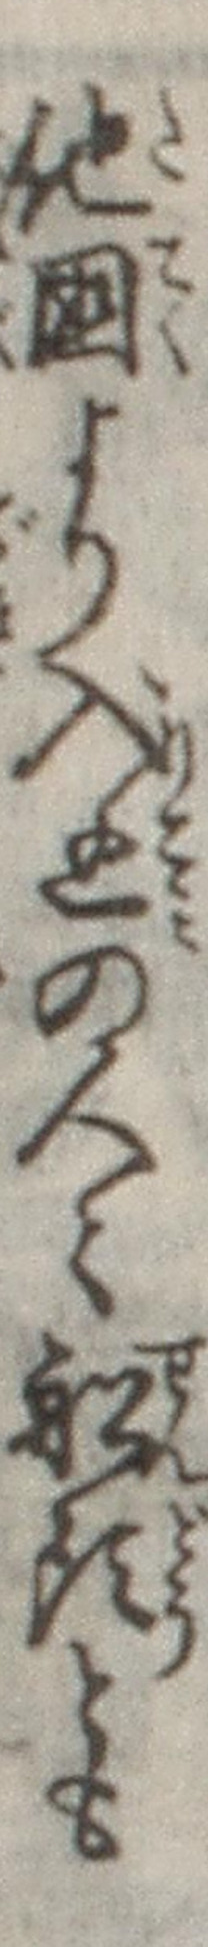他国より入込の人々舩頭とも
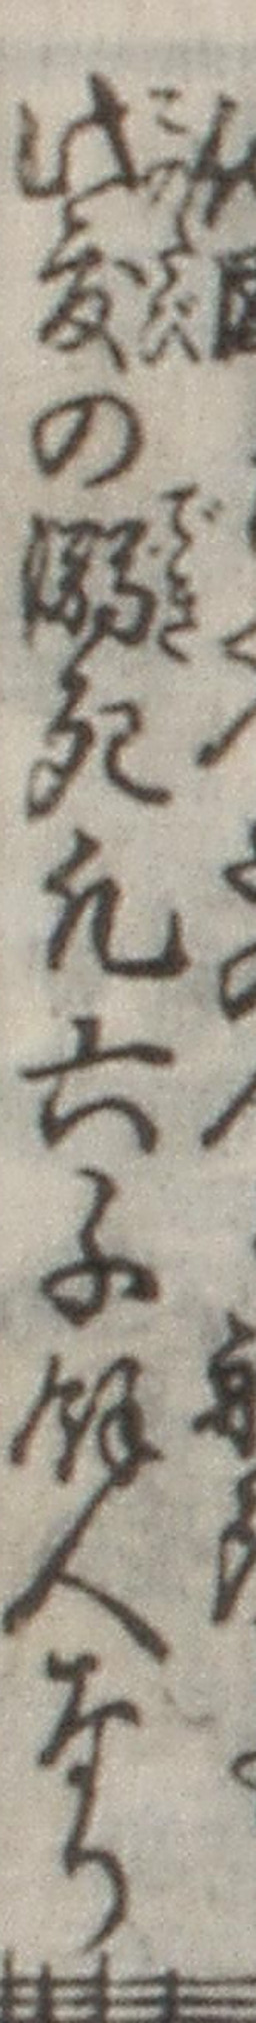此度の溺死凡六千餘人なり

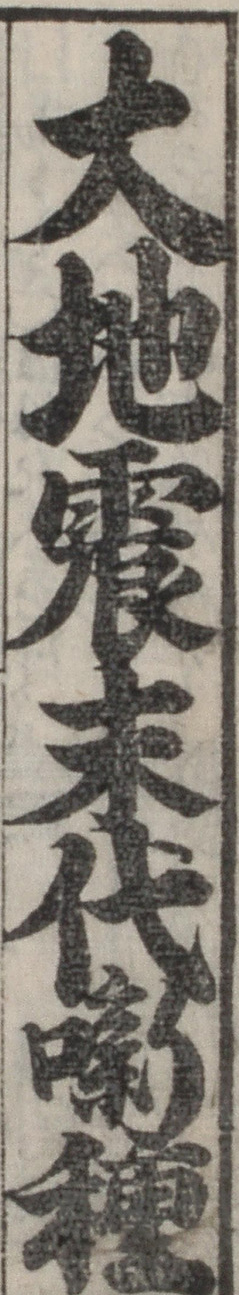大地震末代噺種
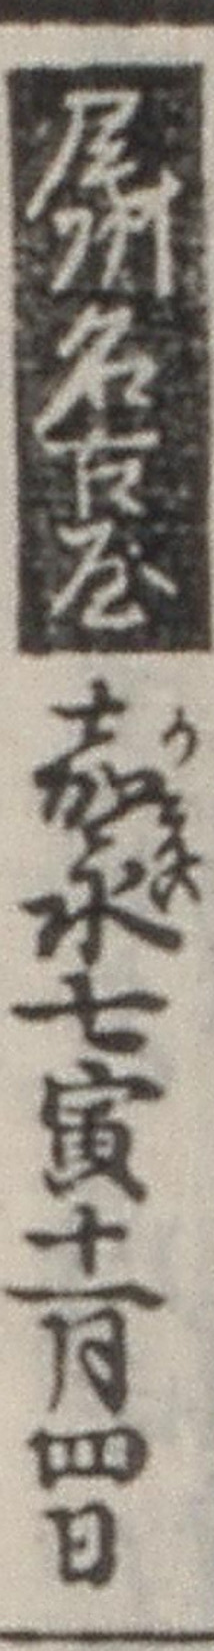尾州名古屋嘉永七寅十二月四日
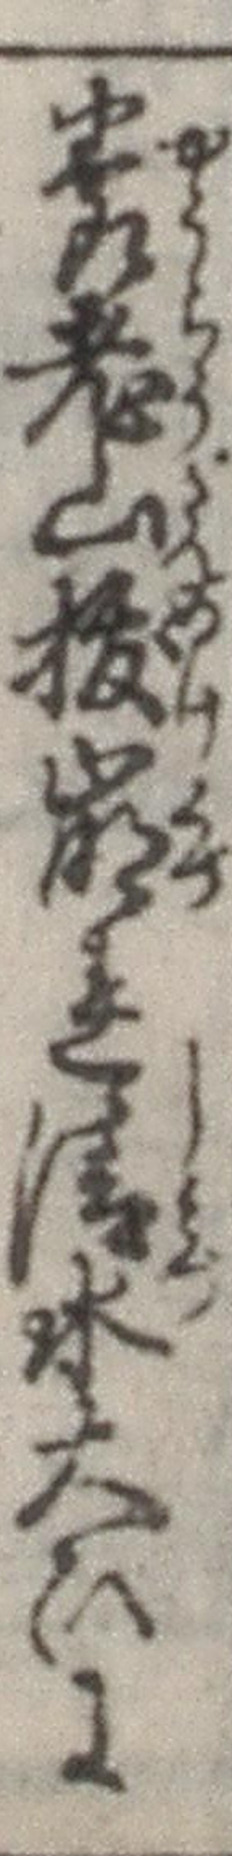養老山抜崩れ清水大ひに
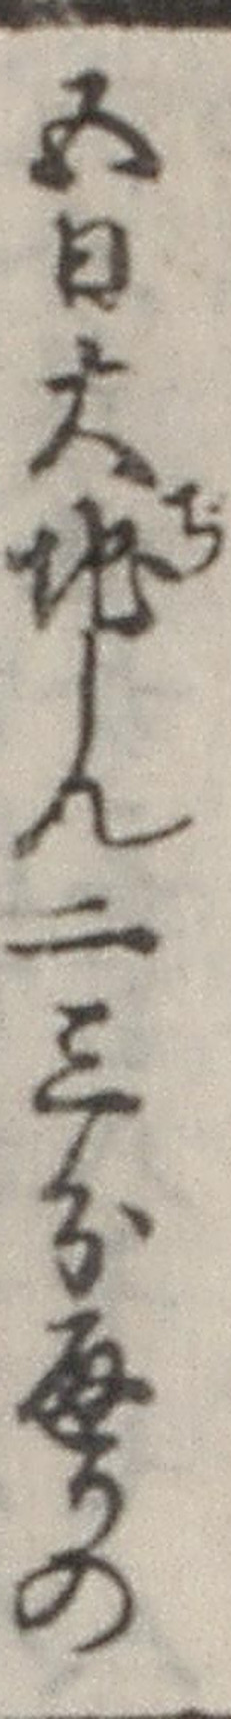五月大地しん二三分通りの
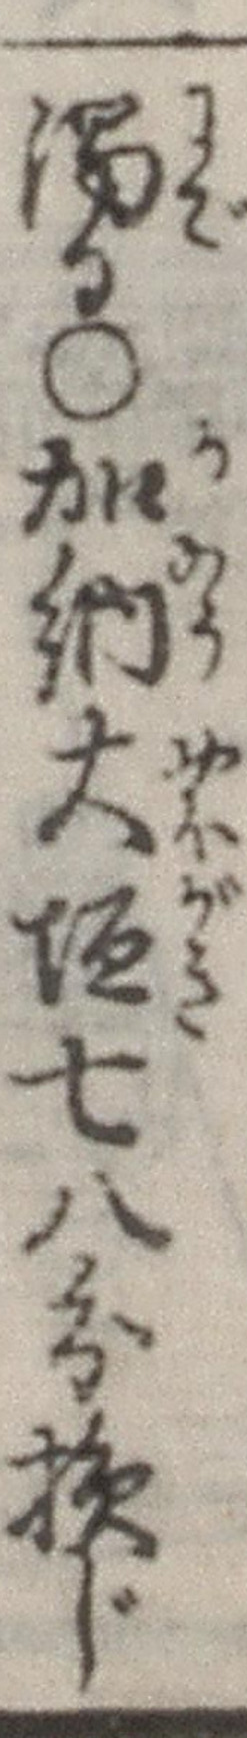濁る○加納大垣七八分損じ
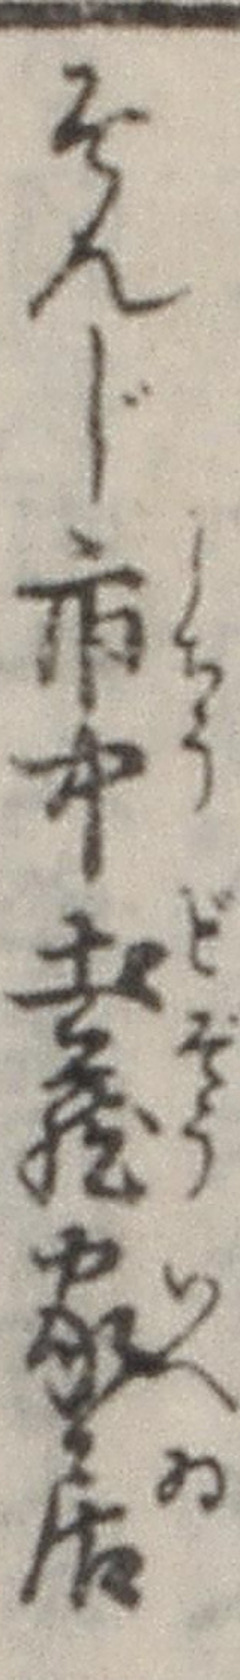そんじ市中土蔵家居
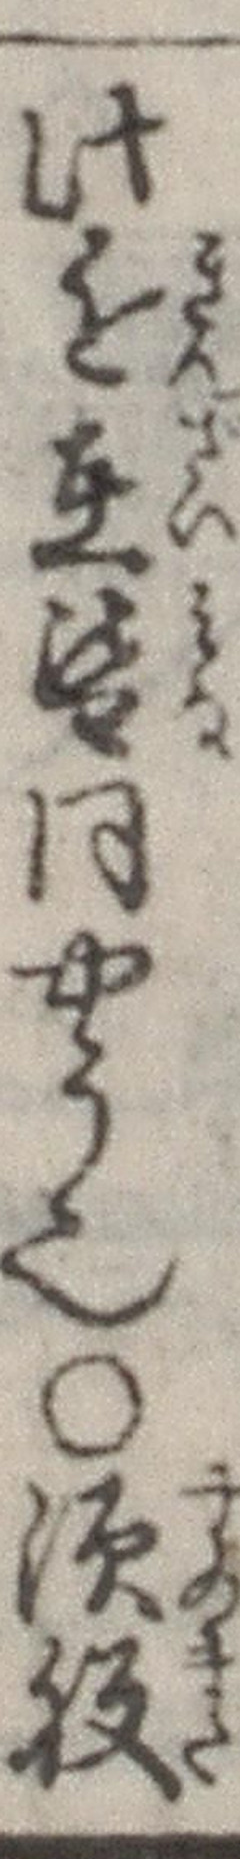此近在皆同やう也○須股
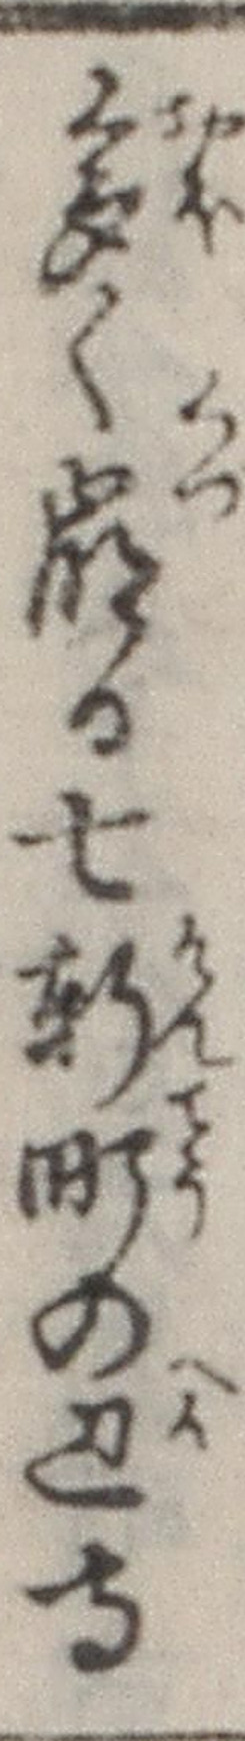多く崩る七軒町の辺寺
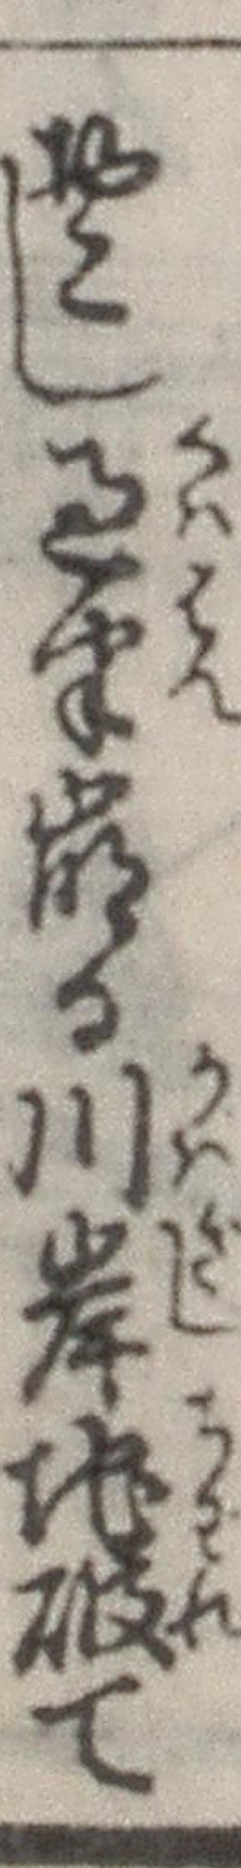おこし過半崩る川岸地破て
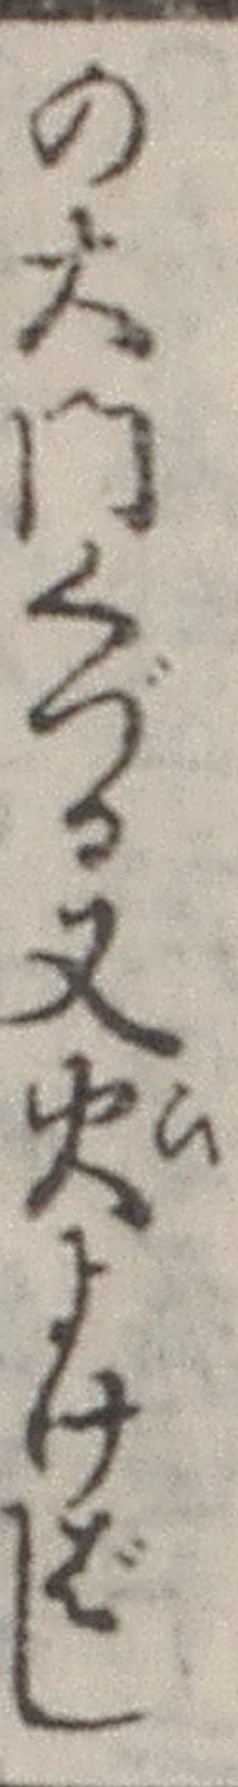の大門くづる又火よけばし
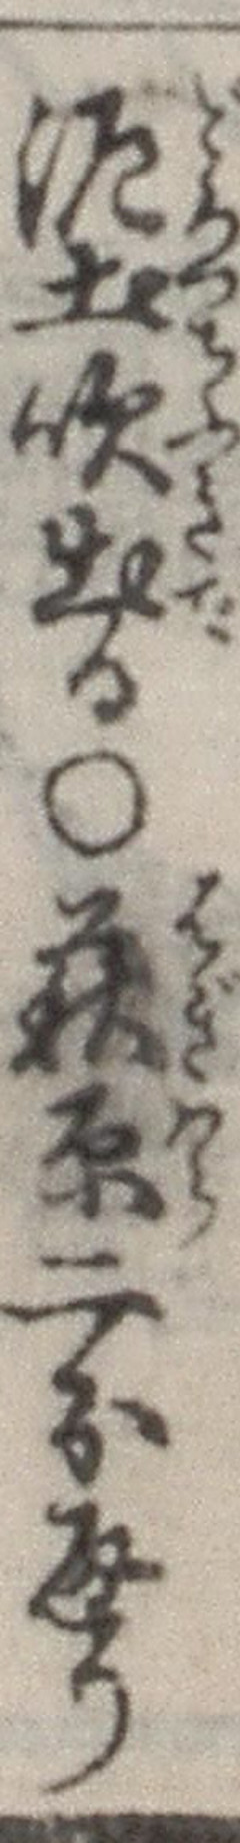泥土吹出○萩原二分通り
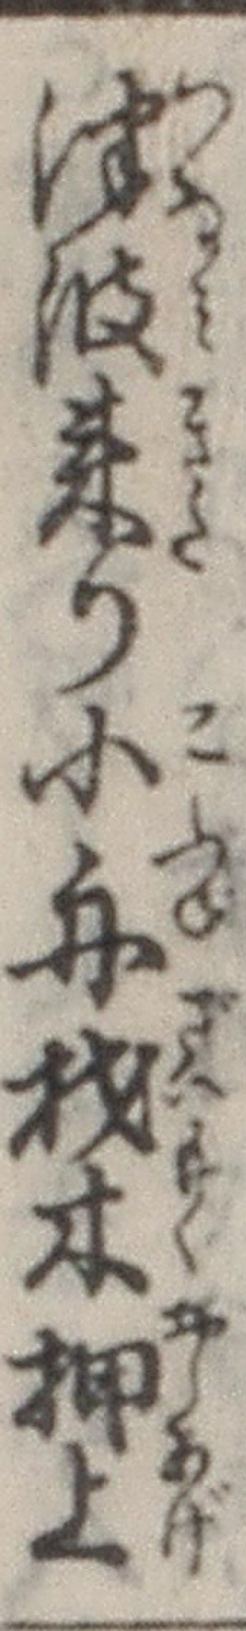津波来り小舟材木押上
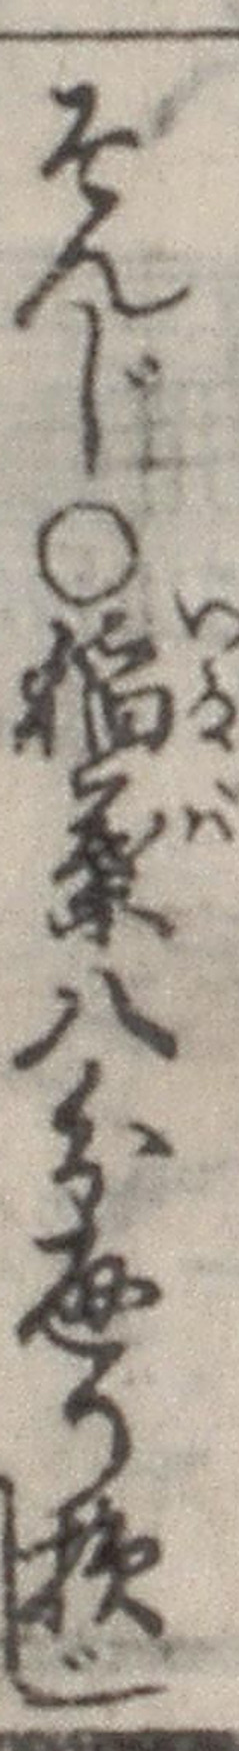そんじ○稲葉八分通り損じ
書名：諸國大地震年代記　末代噺種
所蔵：東京大学地震研究所図書室 Earthquake Research Institute Library, The University of Tokyo, JAPAN
